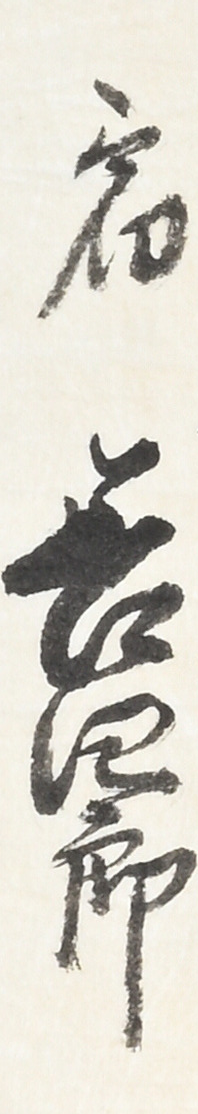宿善四郎
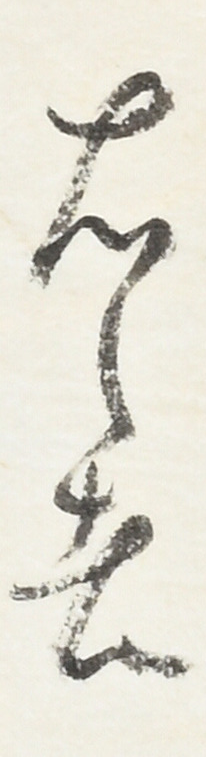右之者
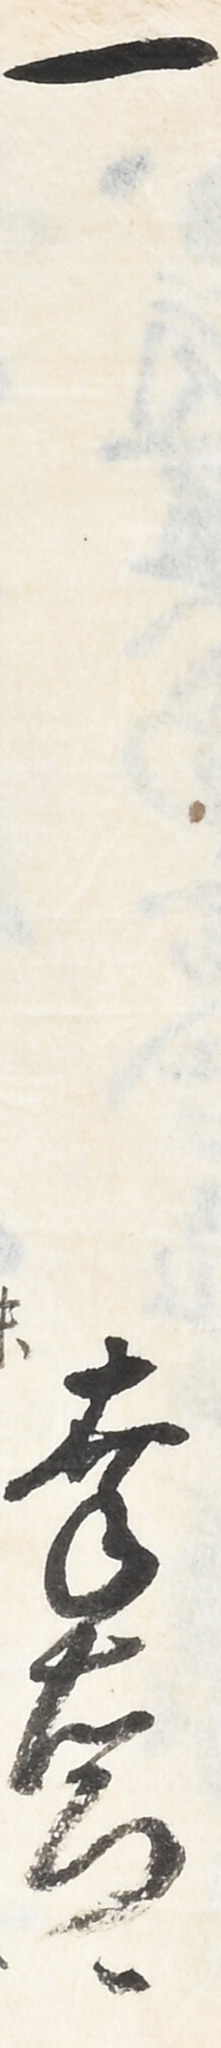宿常右衛門
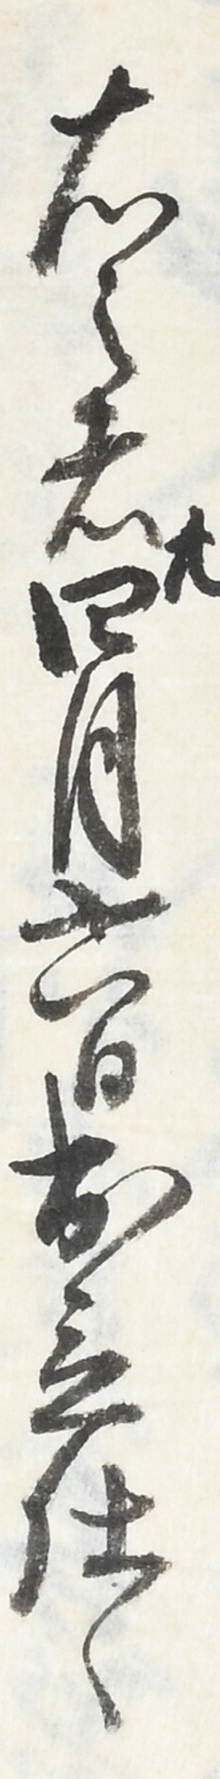右之者同廿日出立仕候

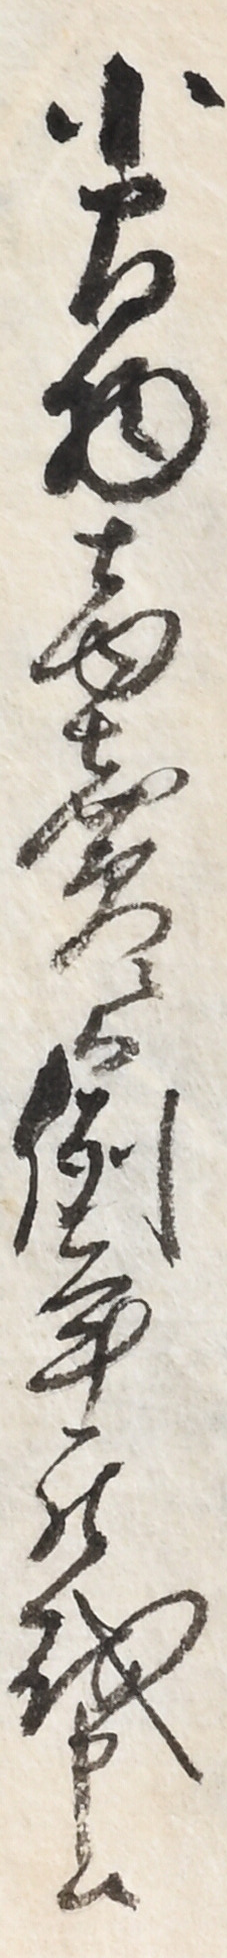植木商売ニ而例年罷越申候
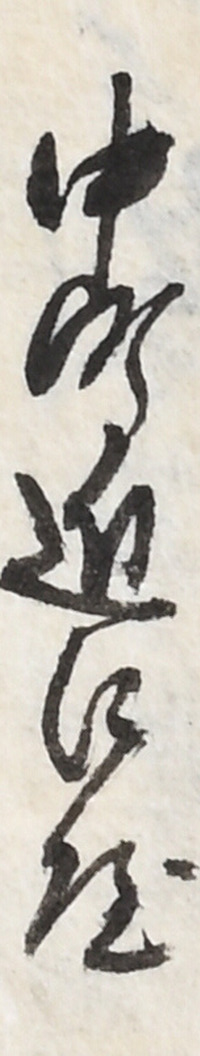中町近江屋
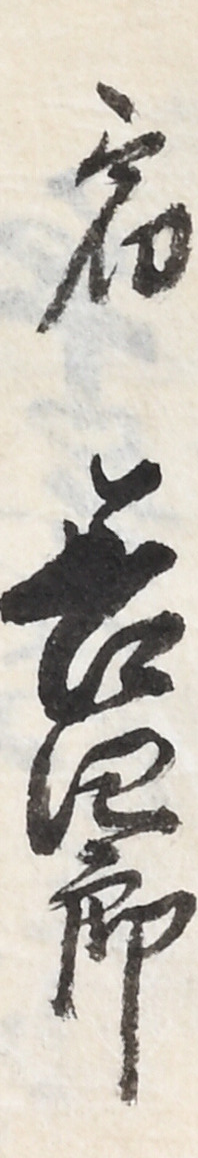宿善四郎
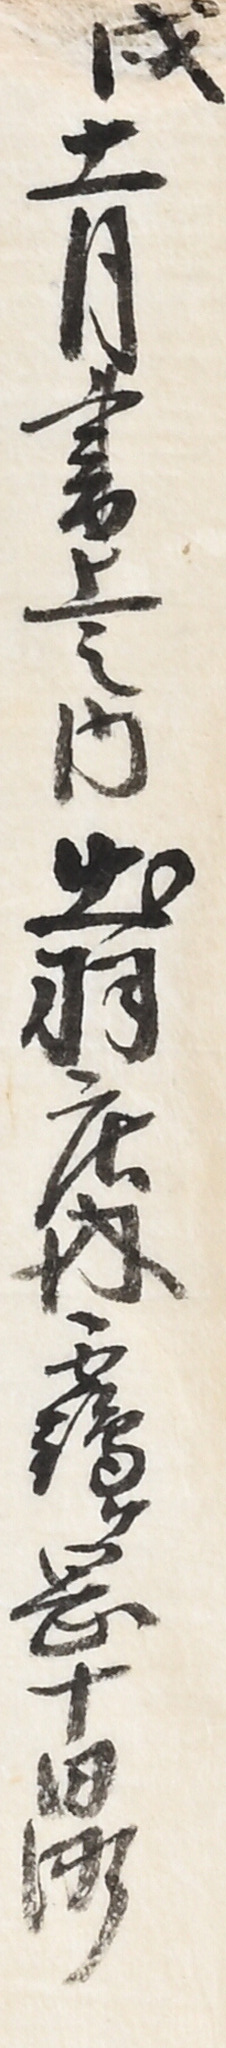戌十一月書上之内出羽庄内鶴ヶ丘十日町
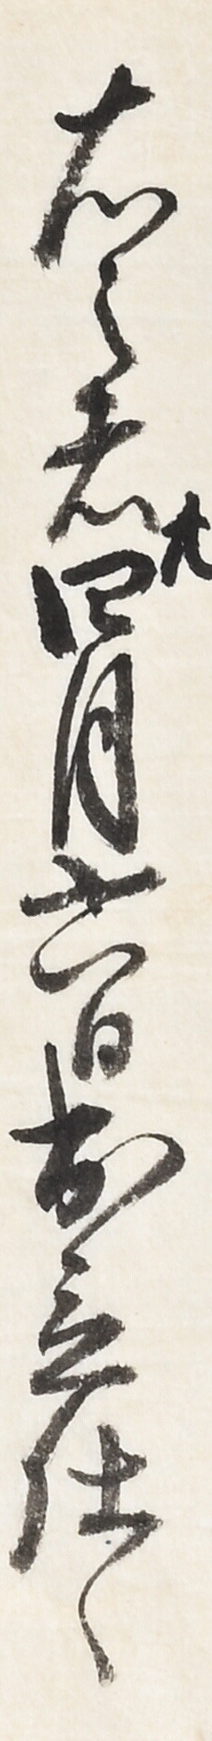右之者四月十六日出立仕候
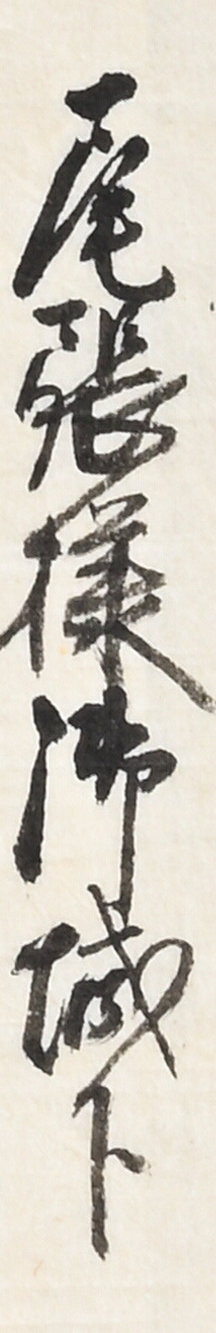尾張様御城下
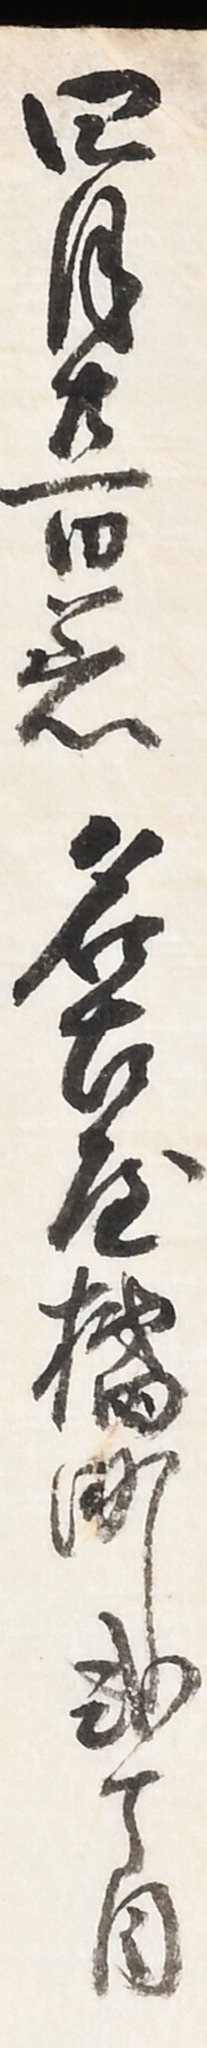四月廿一日着名古屋橘町弐丁目
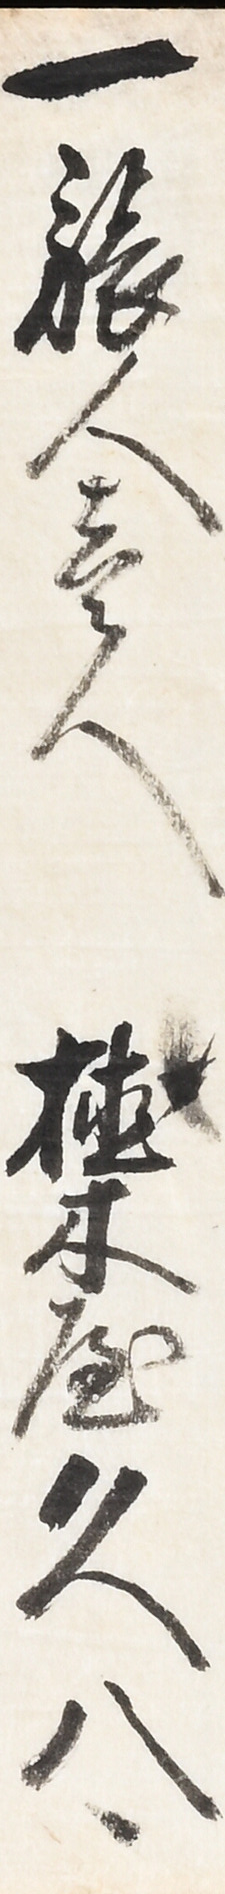一旅人壱人植木屋久八・
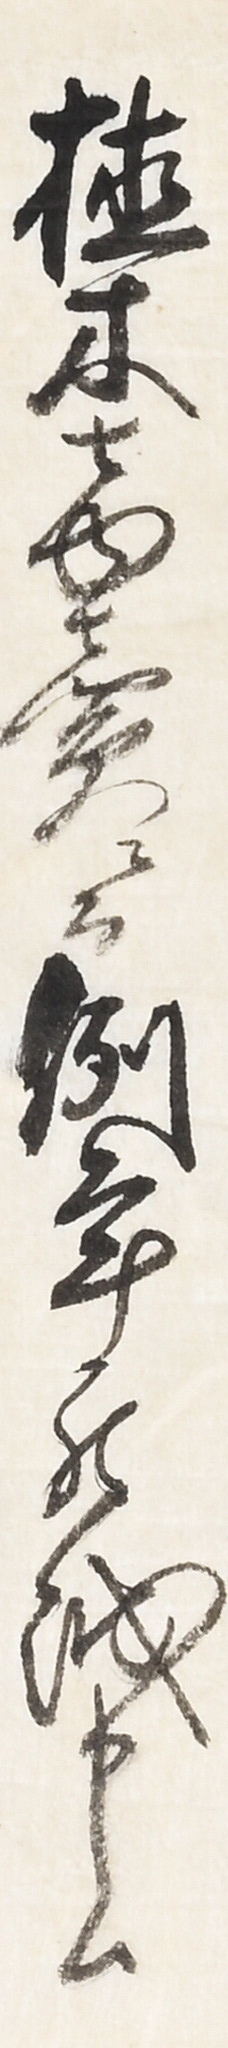植木商売ニ而例年罷越申候
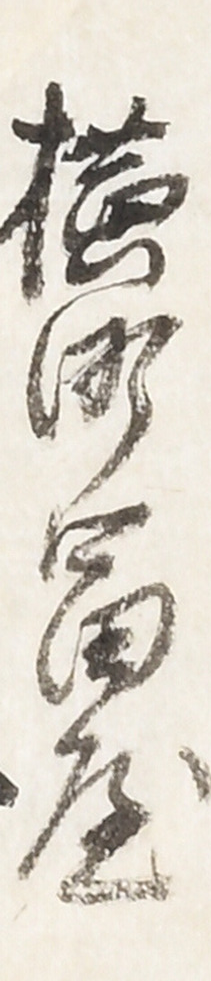横町冨屋
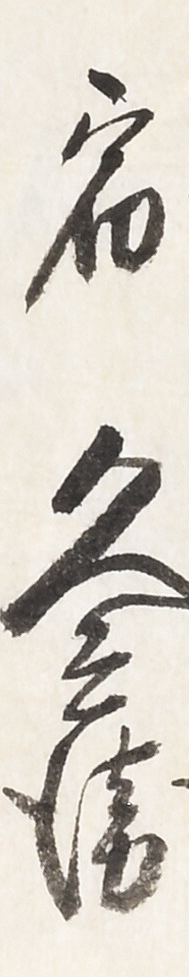宿久兵衛
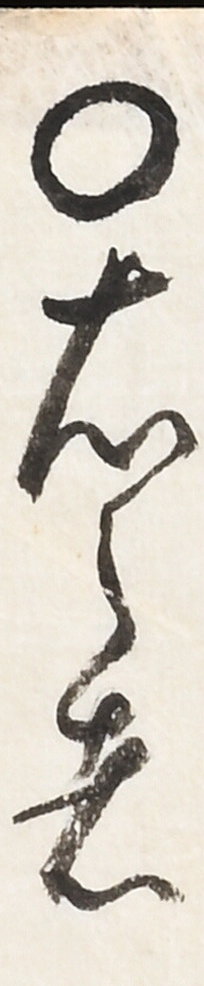〇右之者
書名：旅人泊控帳
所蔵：伊那市立高遠町図書館・合同会社AMANE
